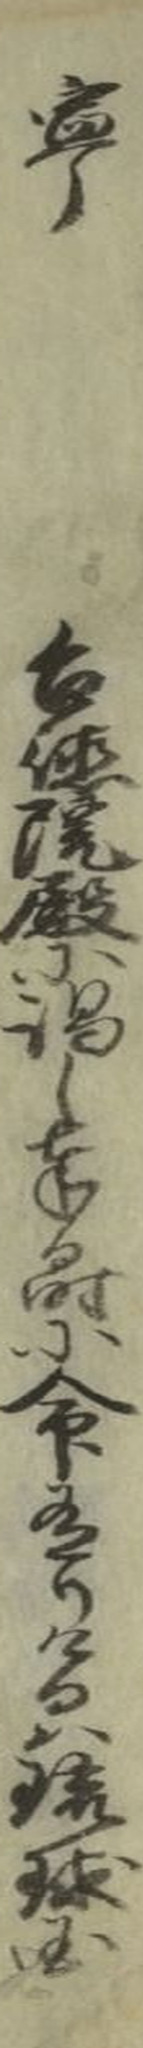寧台徳院殿に謁し奉る時に命有りけるは琉球国
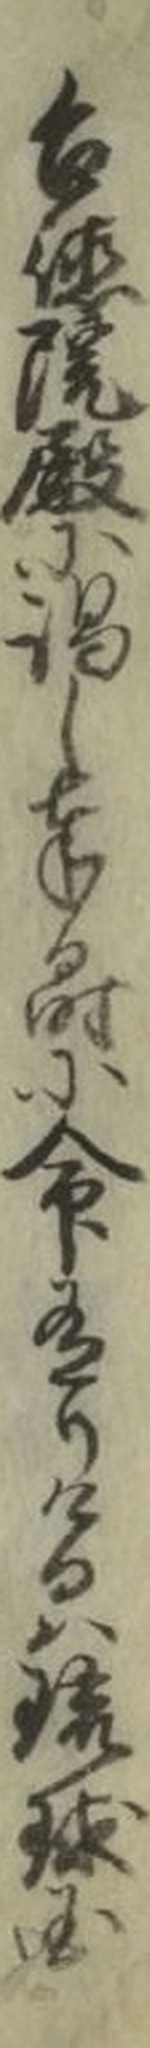寧台徳院殿に謁し奉る時に命有りけるは琉球国
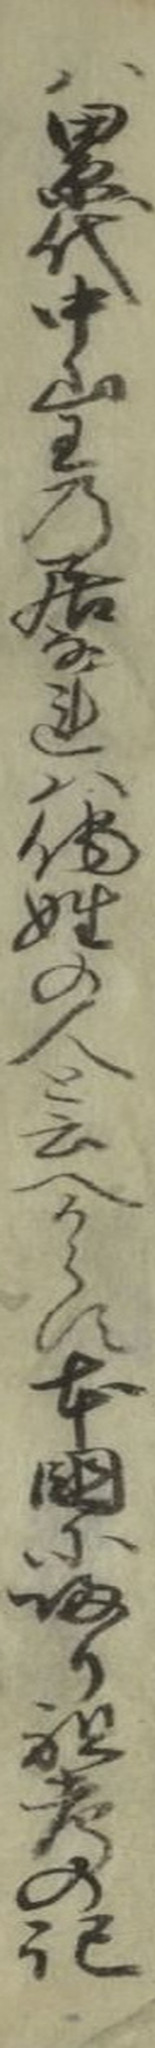は累代中山王の居なれは備姓の人と云へからす本国に帰り祖老の記
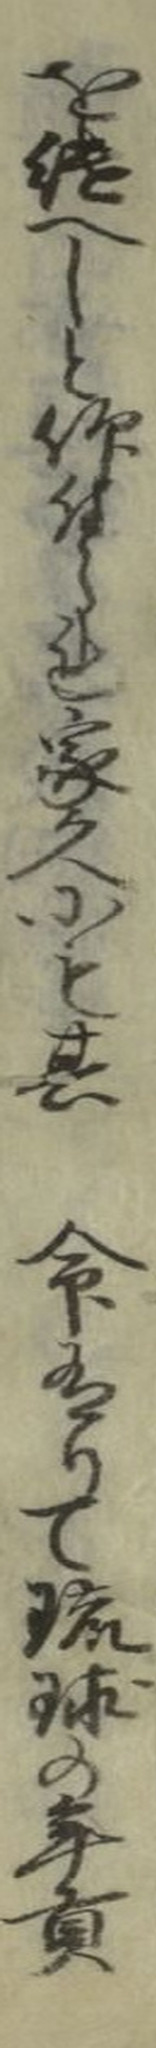を継へしと仰付られ家久にも其命有りて琉球の年貢
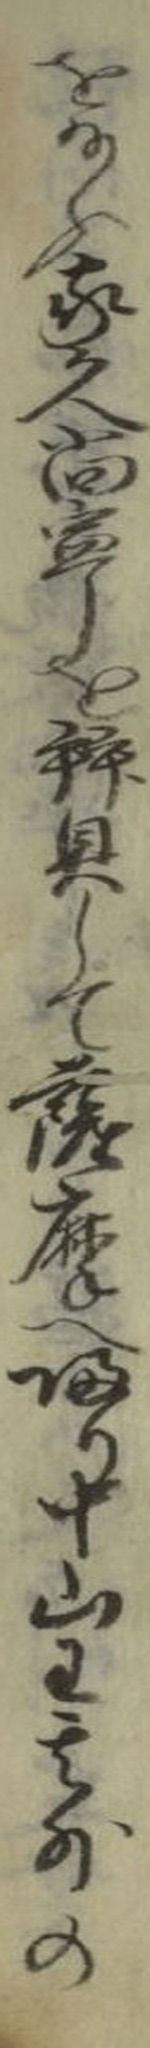を給ふ家久尚寧を拝具して薩摩へ帰り中山王其外の

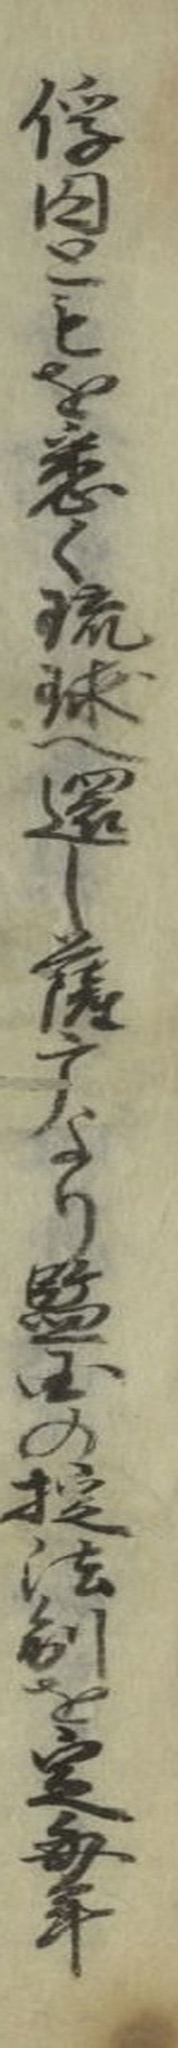俘因ともを悉く琉球へ還し薩摩より監国の掟法制を定毎年
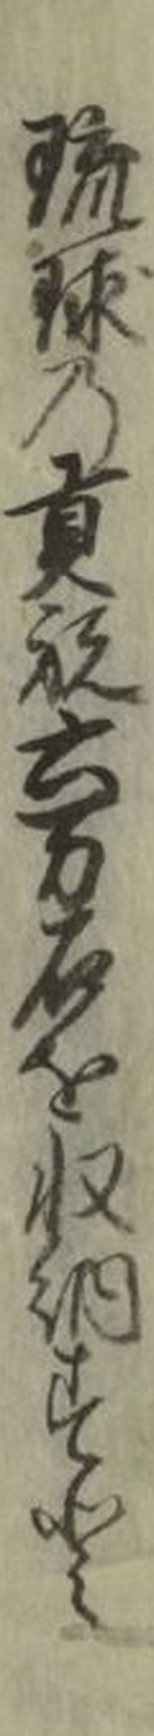琉球の貢税六万石を収納すと
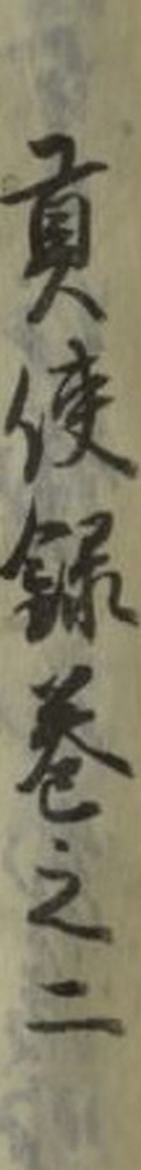貢使録巻之二
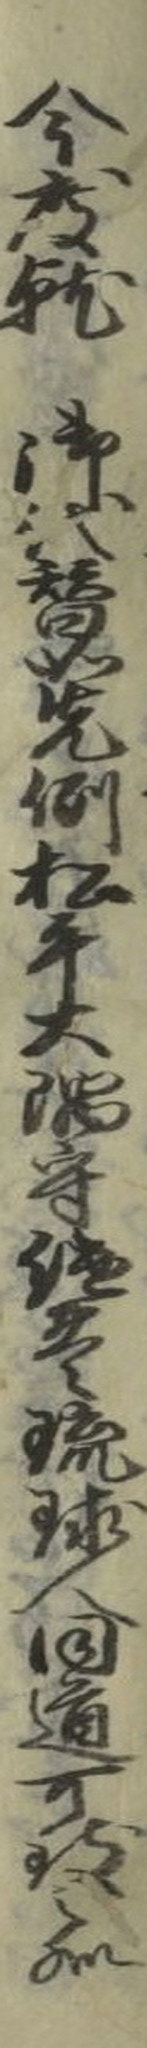今度就御代替如先例松平大隅守琉球人同道可致之処
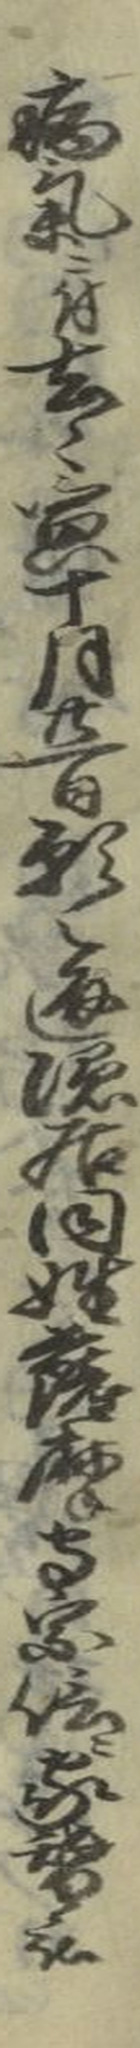病気に付去寅十月廿一日願之通隠居同姓薩摩守宗信に家替被
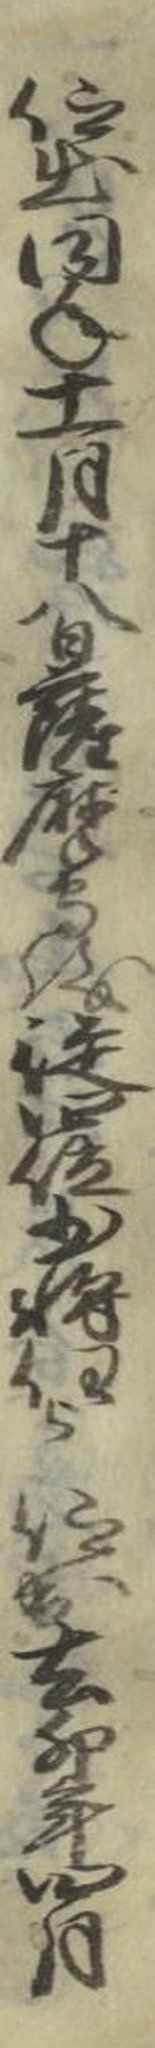仰出同年十一月十八日薩摩守儀従四位少将任被仰出去卯年四月
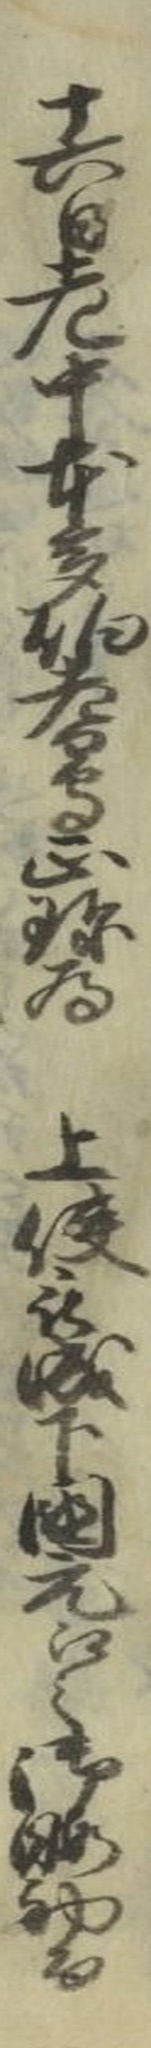十六日老中本多伯耆守正録為上使被成下国元え之御初を
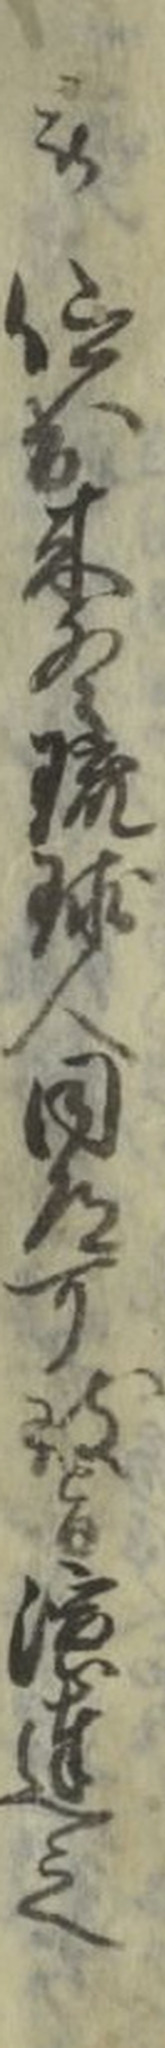被仰出来冬琉球人同道可致旨演達也
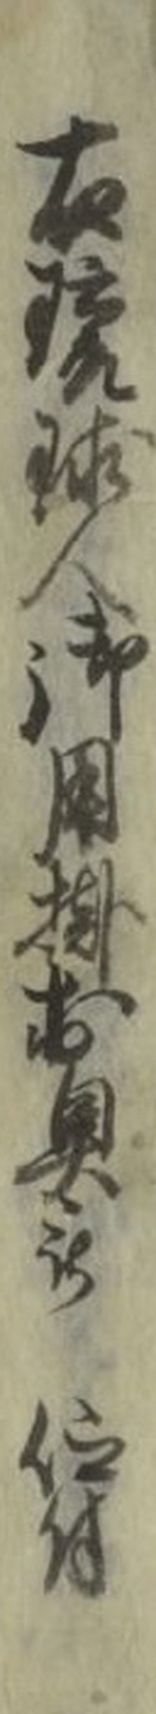右琉球人御用掛於奥被仰付
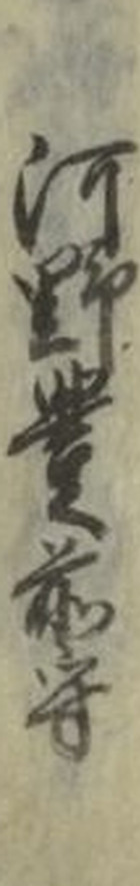河野豊前守
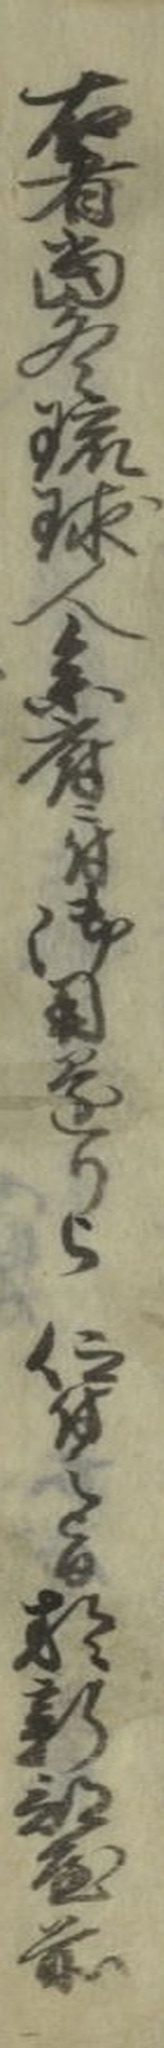右者当冬琉球人参府に付御用遂り被仰付之旨部屋前
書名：琉球人来朝之記
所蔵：University of the Ryukyus Library
